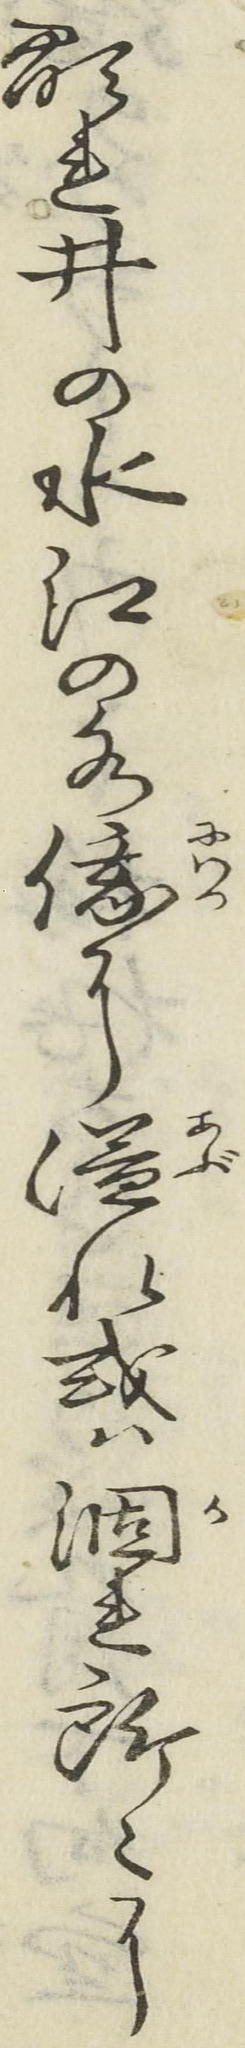顕れ井の水江の水俄に溢れ或は涸れ所々に
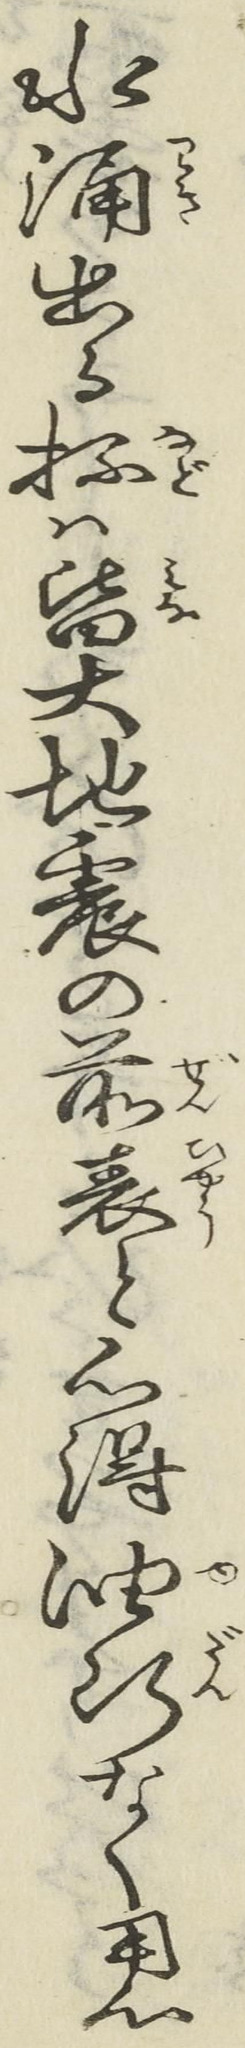水涌出る杯は皆大地震の前表と心得油断なく用心
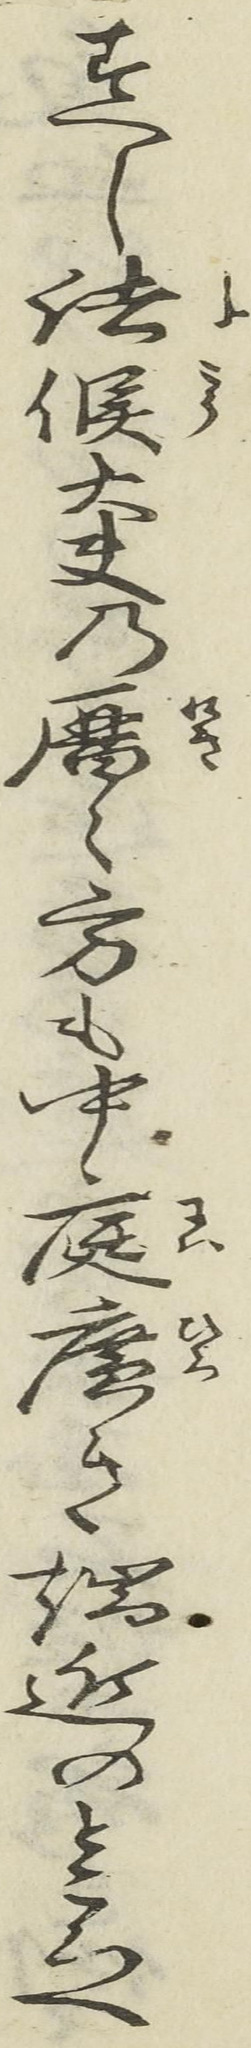すへし諸侯大夫の暦々方も中庭広き端近のところへ
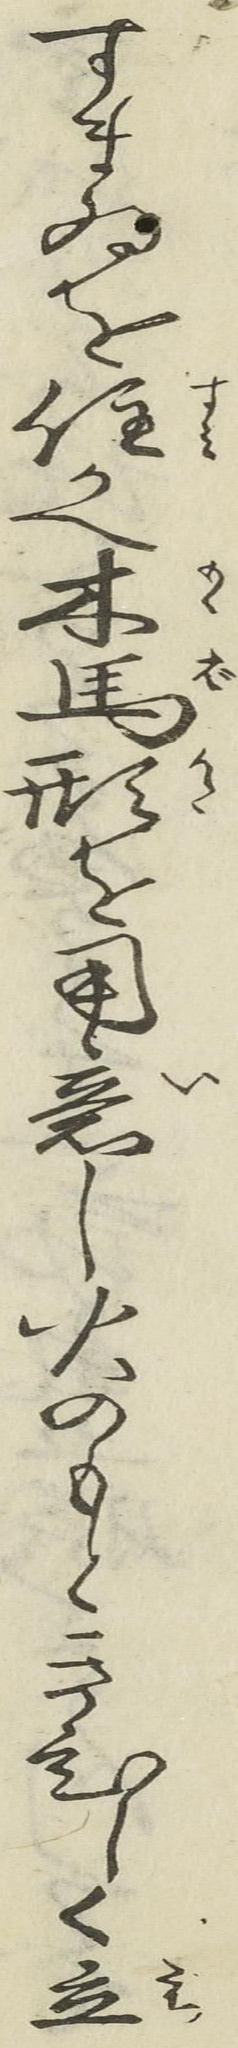すまゐを住かへ木馬形を用意し火のもときひしく立
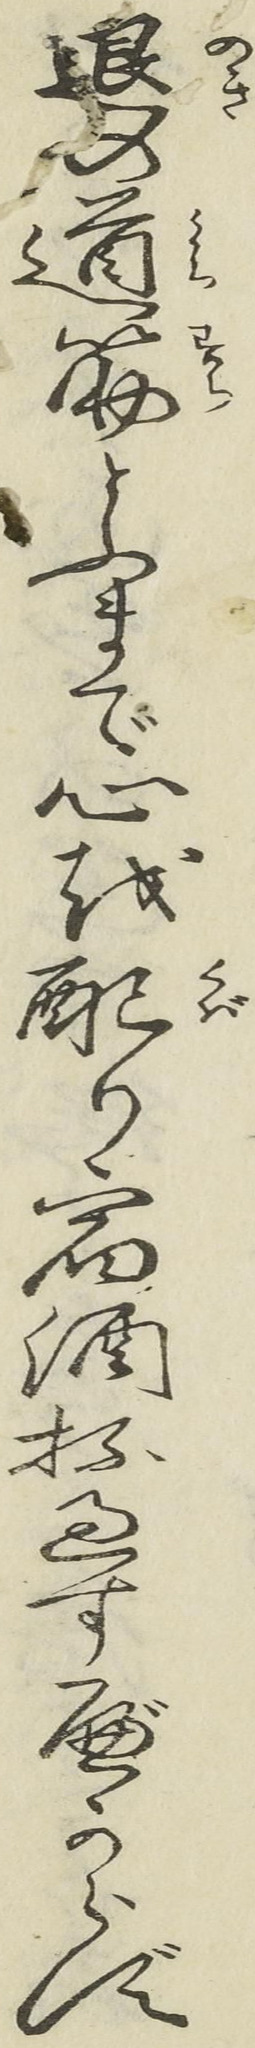退の道筋とふまで心を配り宿酒杯過すべからず
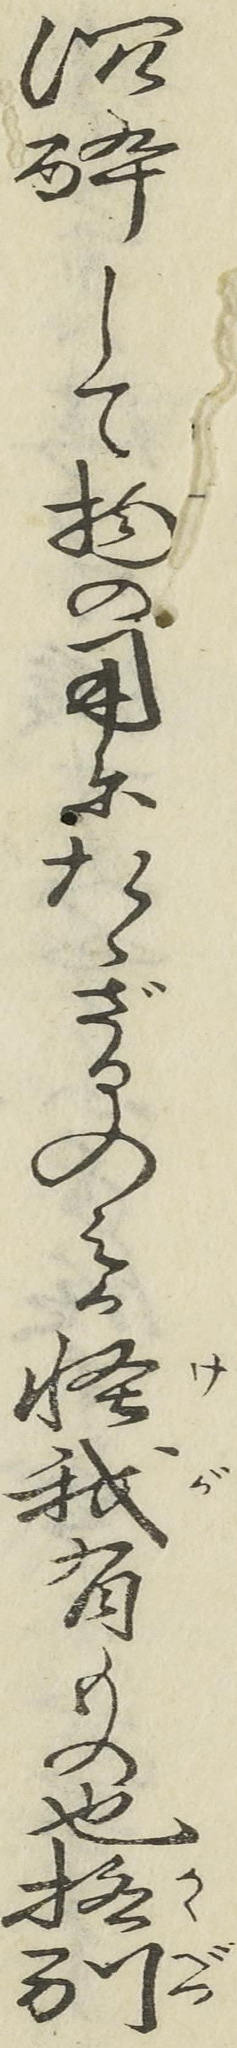泥酔して物の用にたゝざるのみか怪我有もの也格別
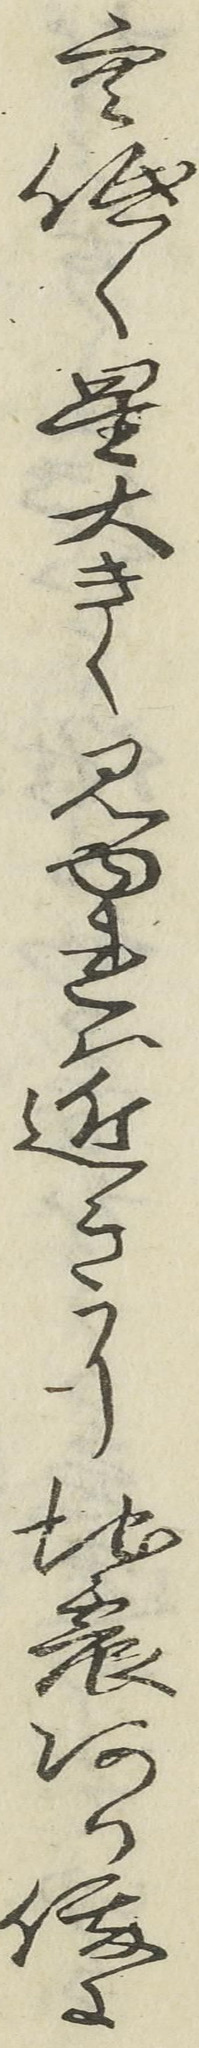空低く星大きく見ゆるは近きに地震あり後に
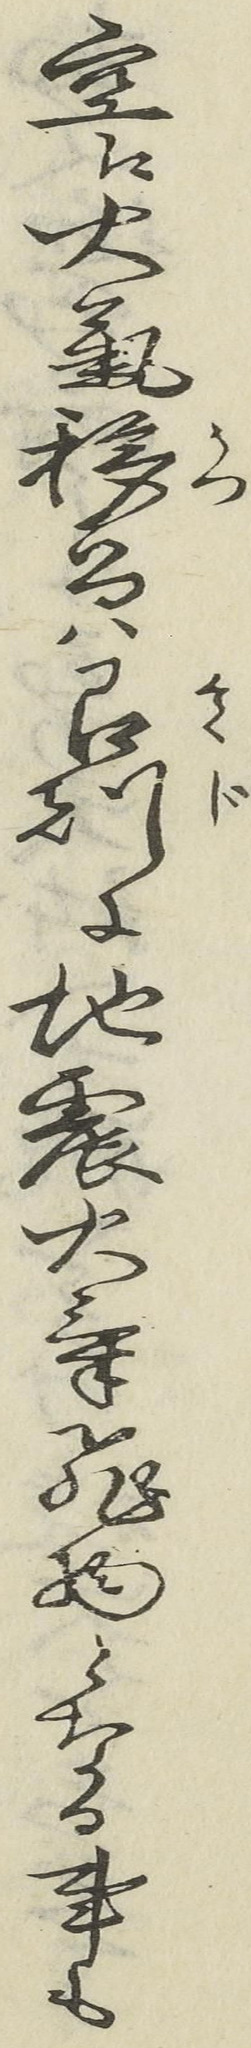空に火気移るは即刻に地震火気籠物となる事も
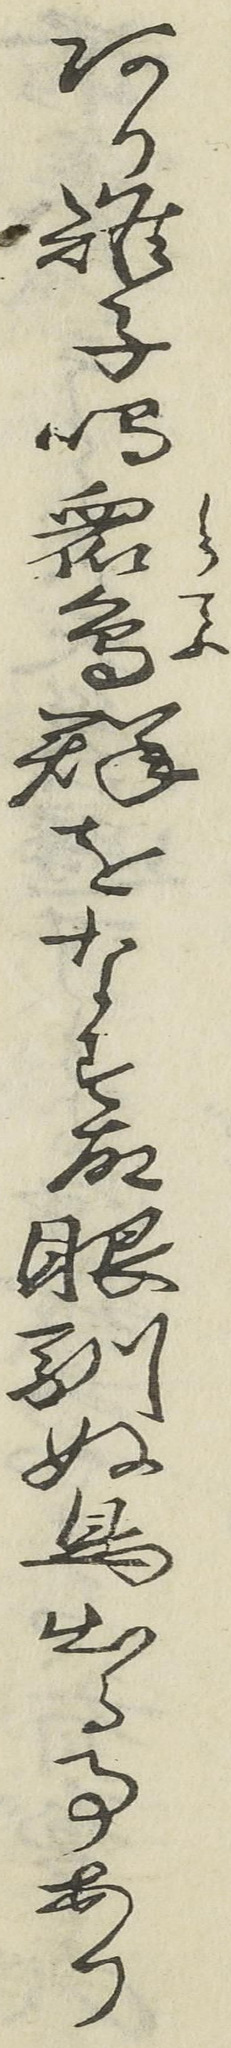あり雉子鳴衆鳥鶏をなす故眼馴ぬ鳥出る事あり
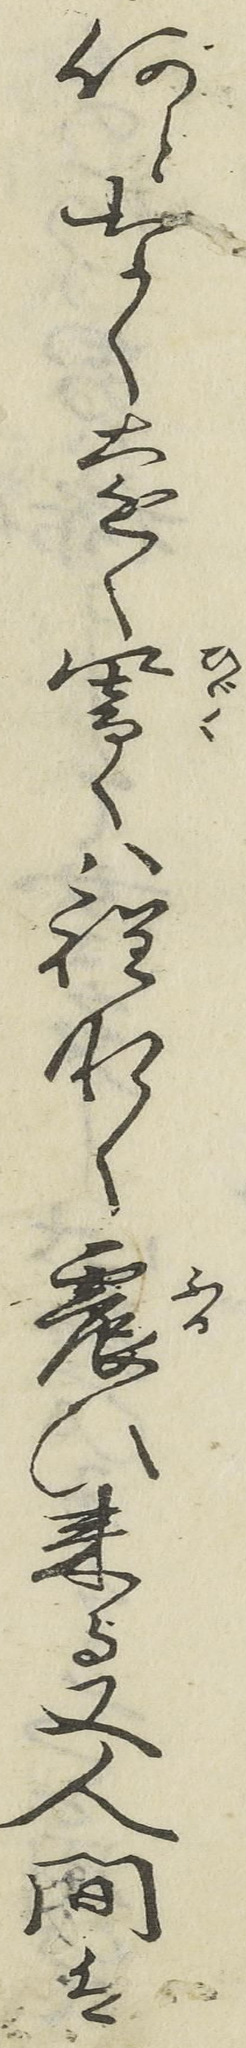何となく土近く響くは程なく震ひ来る又人間は
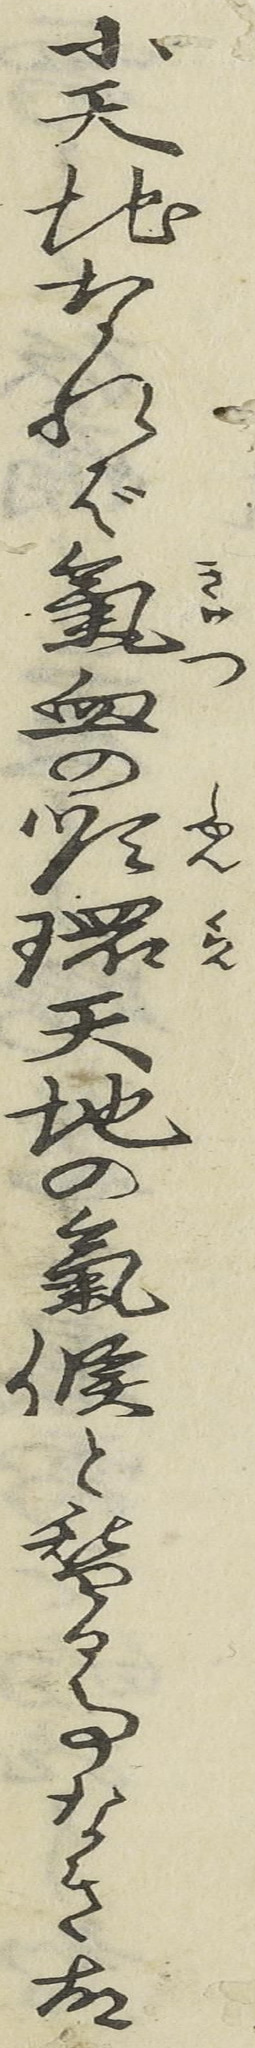小天地なれば気血の循環天地の気候と替る事なき故

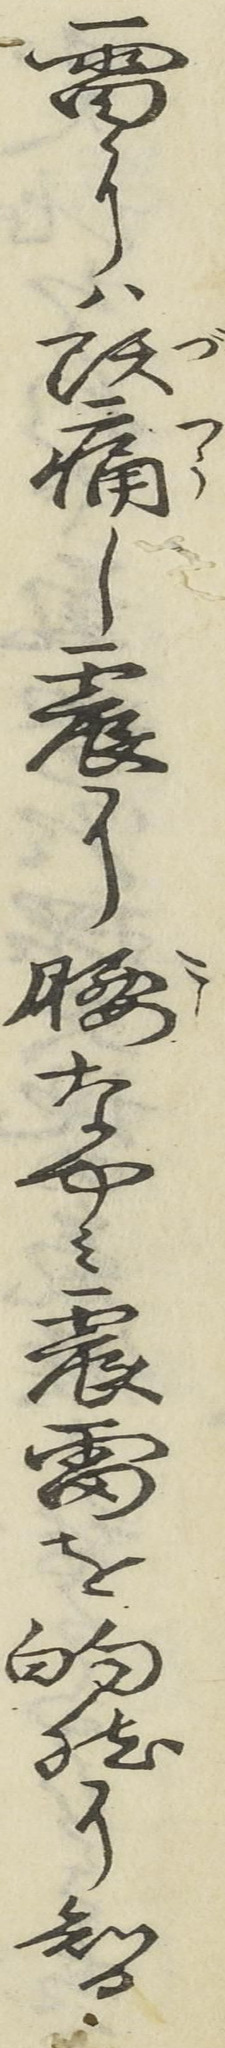雷には頭痛し震に腰なやみ震雷を的然に知る
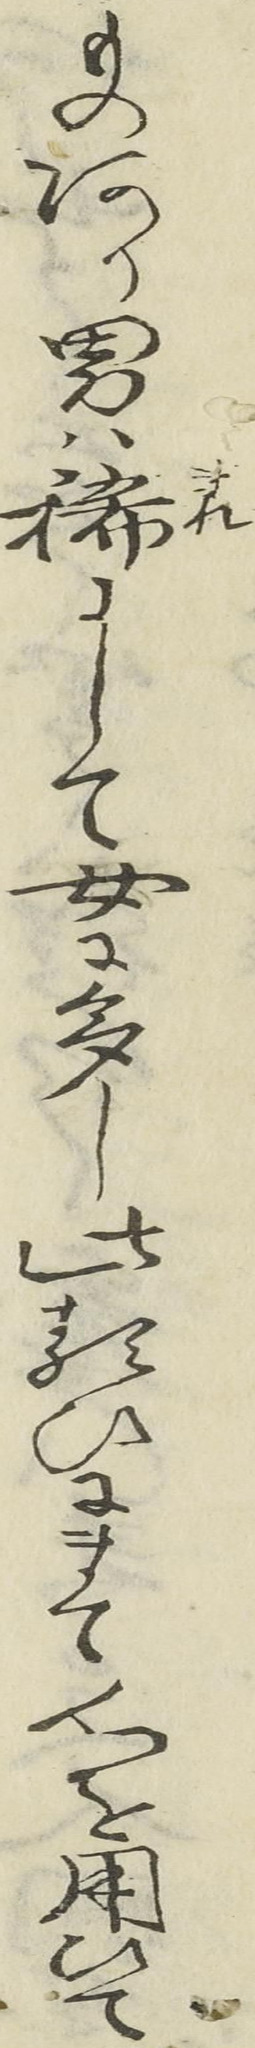ものあり男は稀にして女に多し此類ひにまて心を用ひて
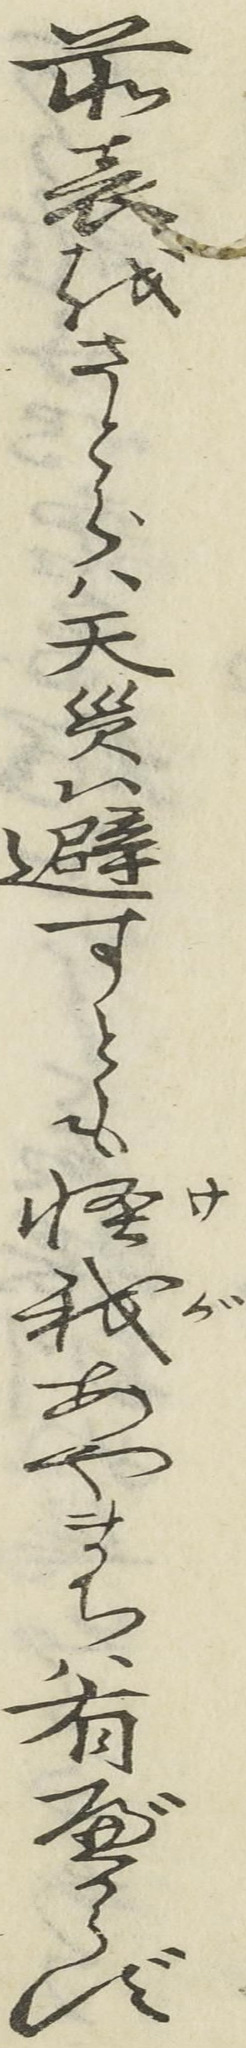前表をさとらは天災は避すとも怪我あやまちは有べからず
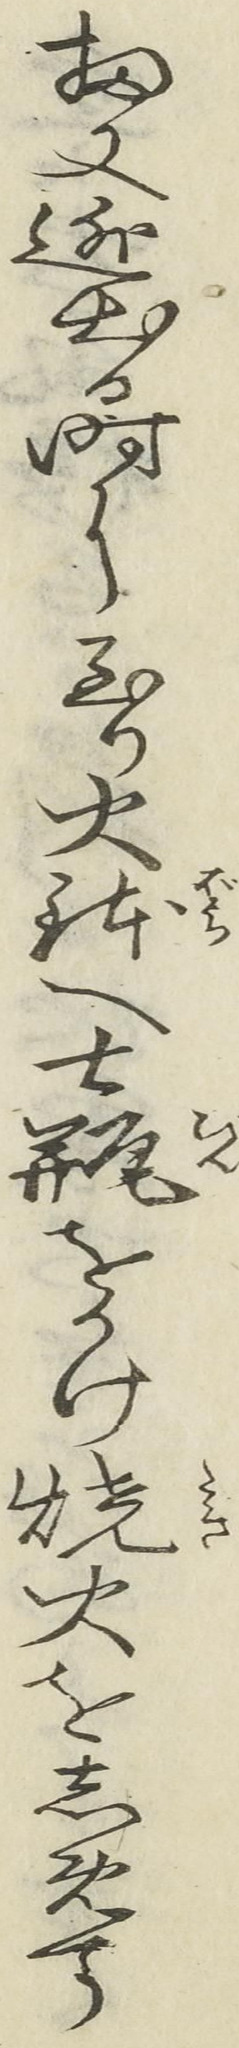物又逃出るときに至り火鉢へ土瓶をかけ焼火をしめす
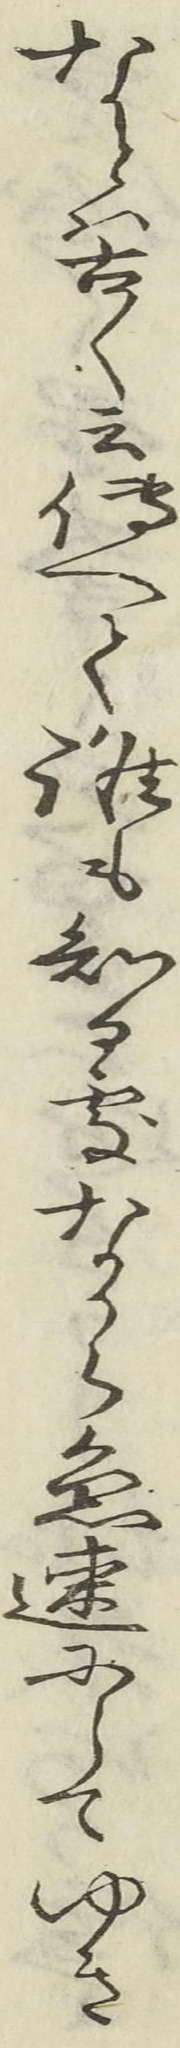なるは古く云伝えて誰も知る處なから急速にしてゆき
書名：震雷考説　全
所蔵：東京大学地震研究所図書室 Earthquake Research Institute Library, The University of Tokyo, JAPAN
